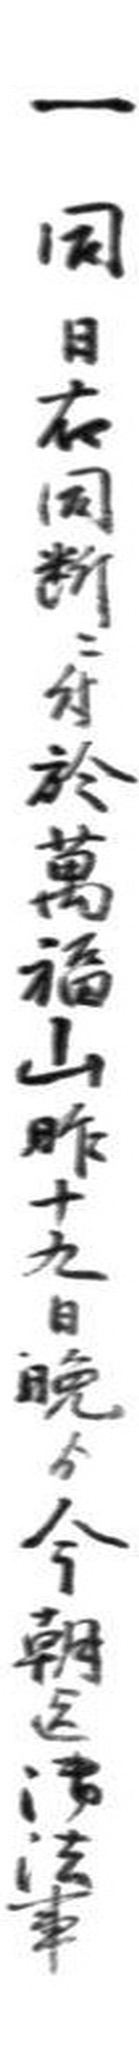一同日右同断ニ付於萬福山昨十九日晩ゟ今朝迄御法事
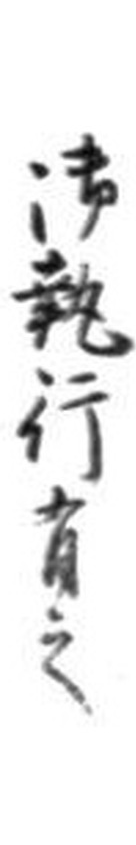御執行有之
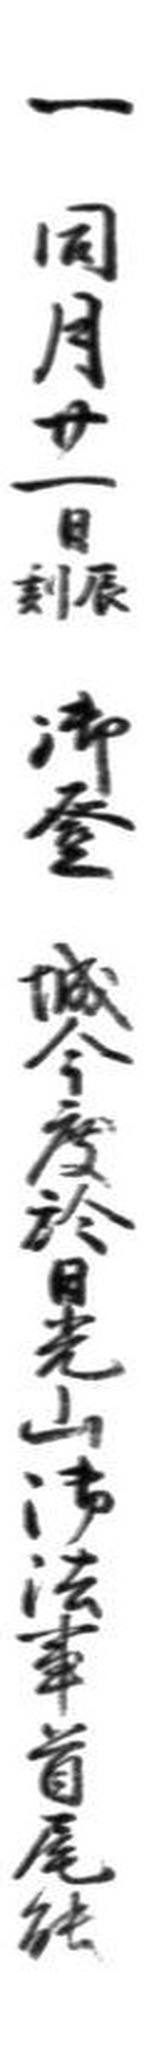一同月廿一日辰刻御登城今度於日光山御法事首尾能

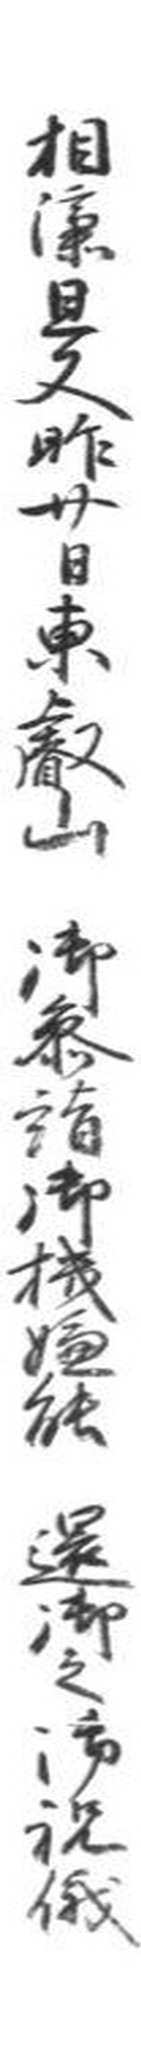相済且又昨廿日東叡山御参詣御機嫌能還御之御祝儀
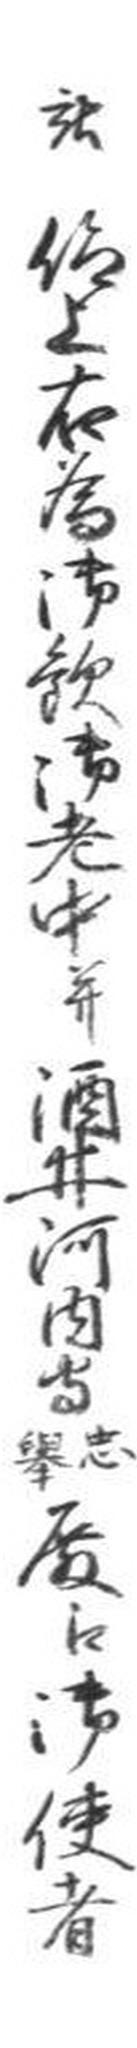被仰上右為御歓御老中并酒井河内守忠擧殿江御使者
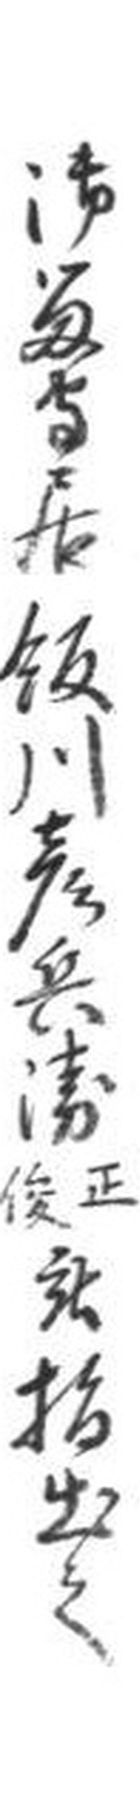御留守居飯川彦兵衛正俊被指出之
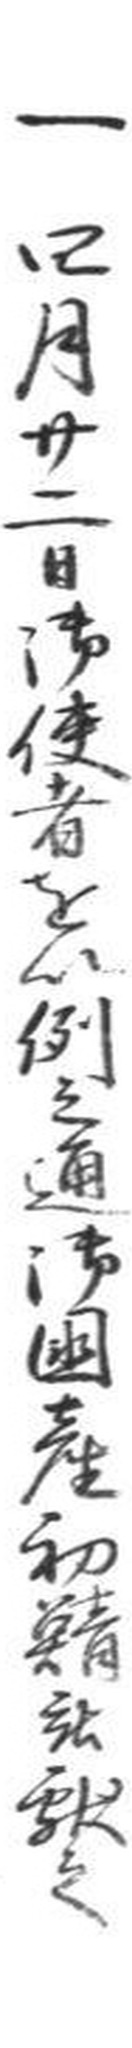一四月廿二日御使者を以例之通御国産初鯖被献之
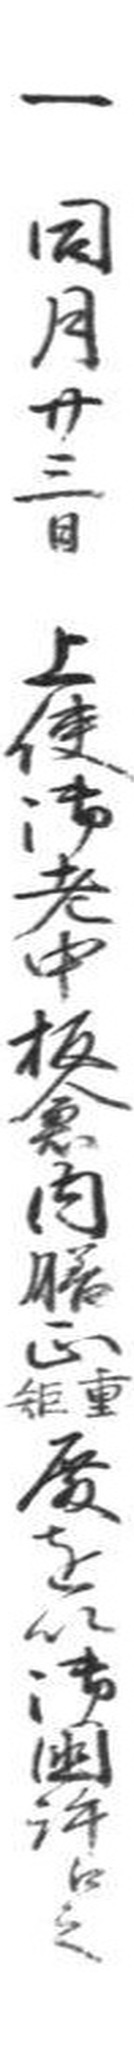一同月廿三日上使御老中板倉内膳正重矩殿を以御国許江之
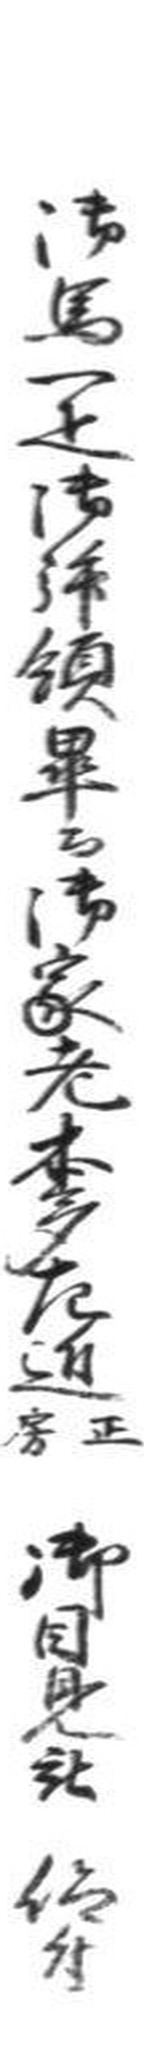御馬一疋御拝領畢而御家老本多左近正房御目見被仰付
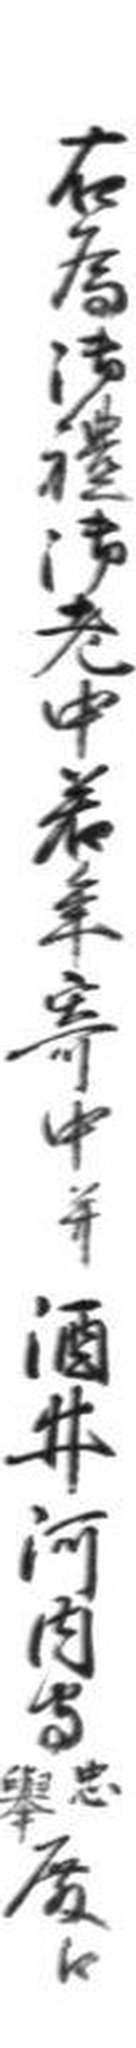右為御礼御老中若年寄中并酒井河内守忠擧殿江
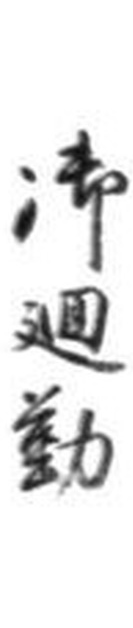御廻勤
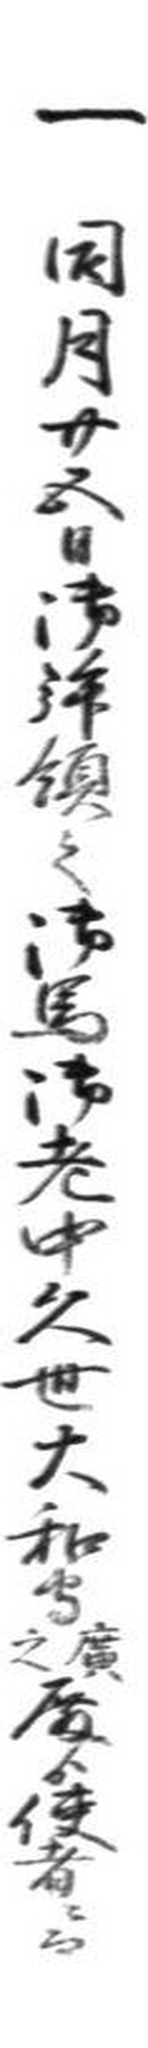一同月廿五日御拝領之御馬御老中久世大和守広之殿ゟ使者ニ而
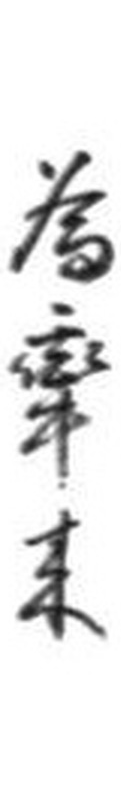為牽来
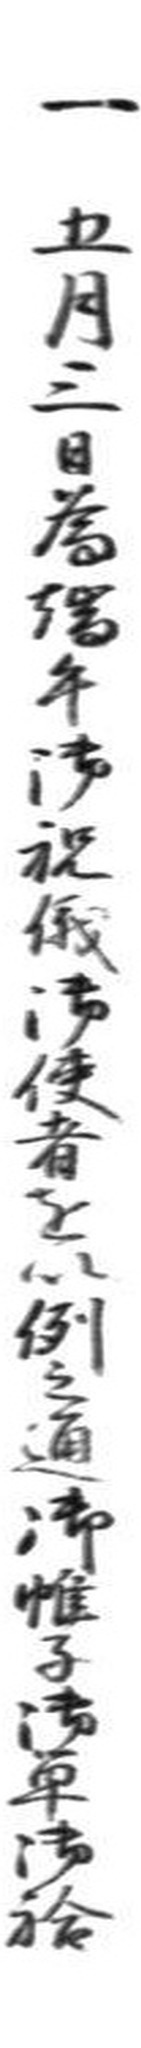一五月三日為端午御祝儀御使者を以例之通御帷子御単御袷
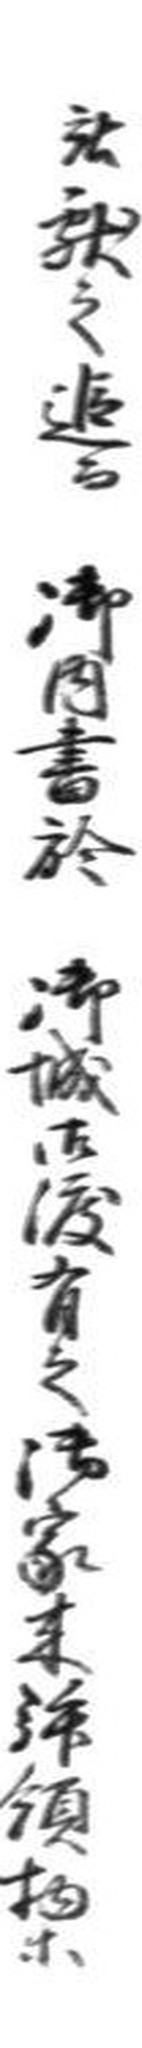被献之追而御内書於御城御渡有之御家来拝領物等
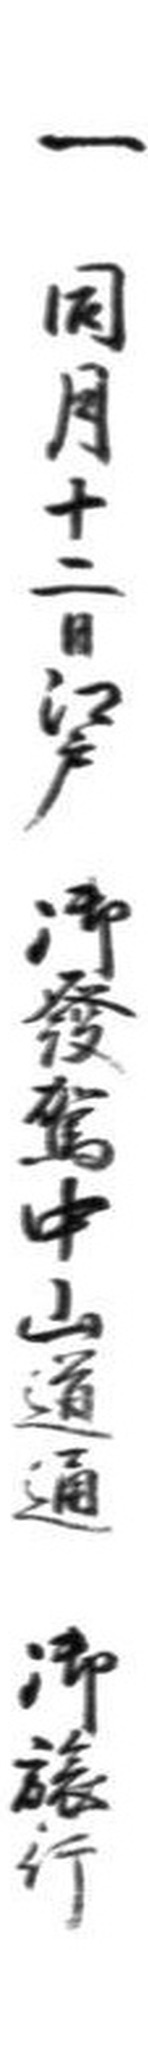一同月十二日江戸御発駕中山道通御旅行
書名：家譜 八 光通公 従寛文十年到同十二年
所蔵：福井県文書館 Fukui Prefectural Archives
